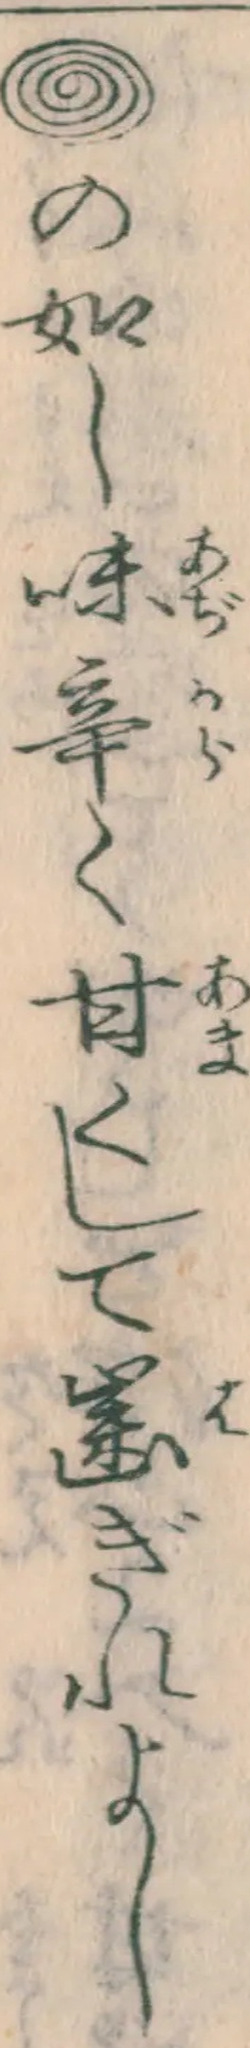の如し味辛く甘くして歯ぎれよし
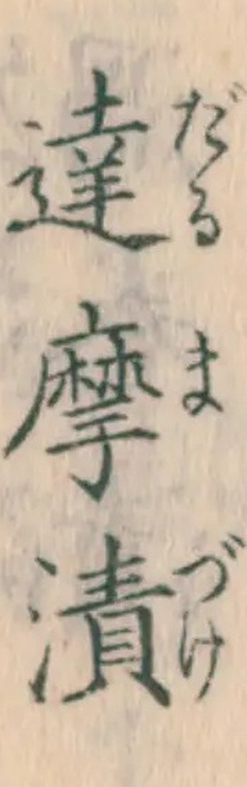達摩漬
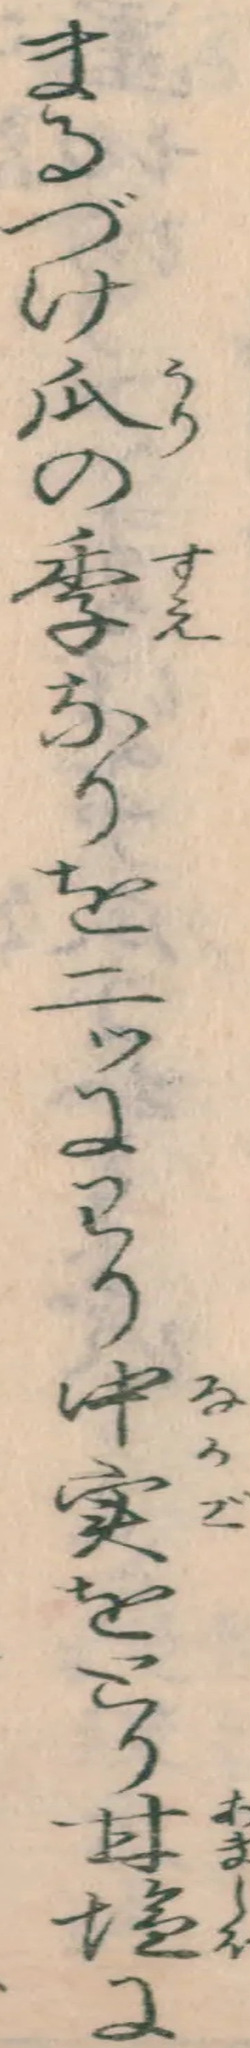まるづけ瓜の季なりを二ッにわり中実をとり甘塩に
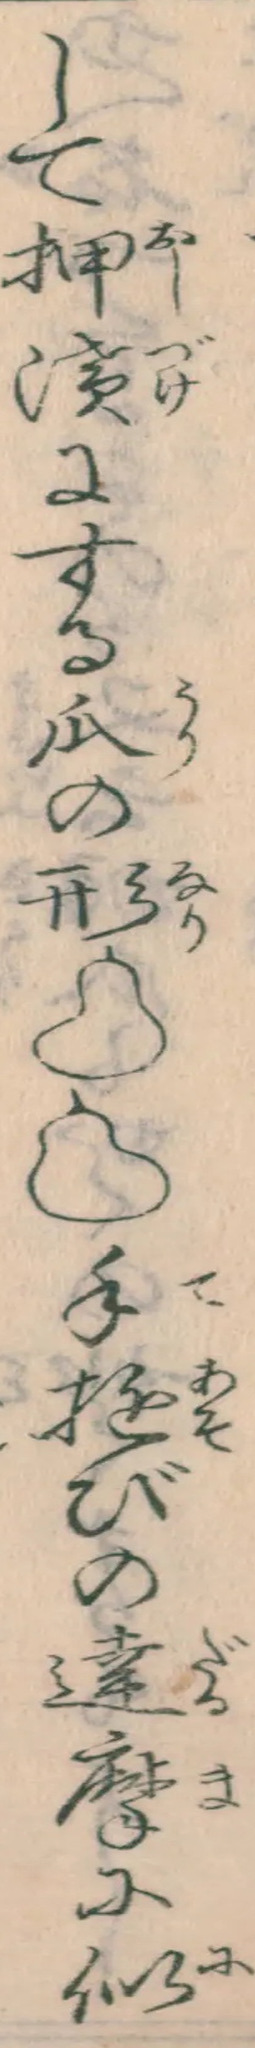して押漬にする瓜の形手遊びの達摩に似
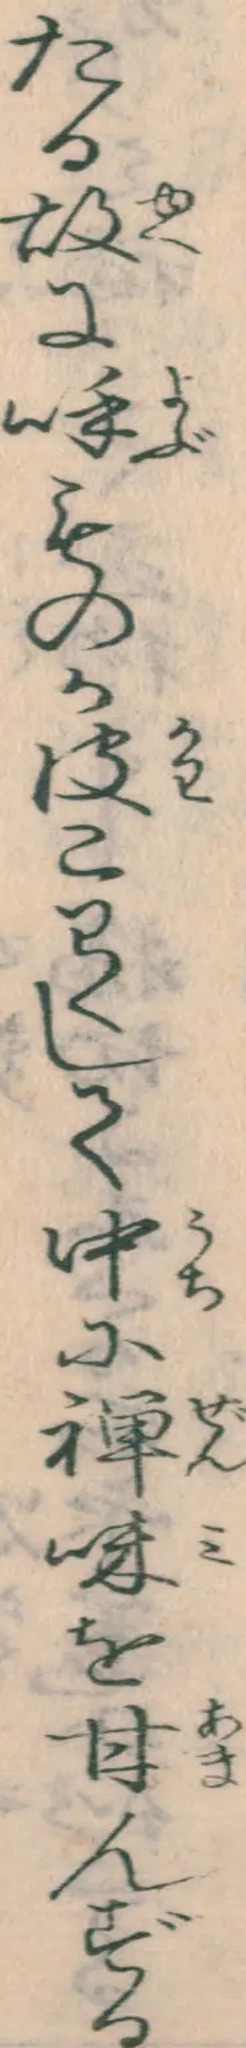たる故に呼ものか皮こわくして中に禅味を甘んずる
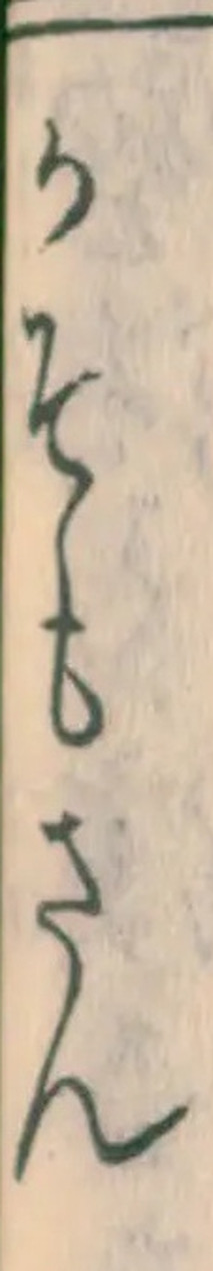かそもさん
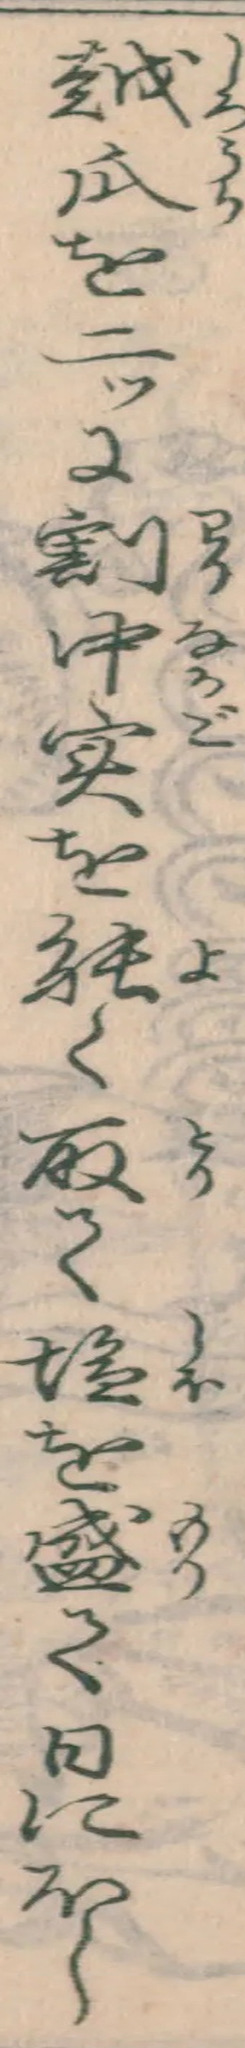越瓜を二ッに割中実を能く取て塩を盛て日にほし
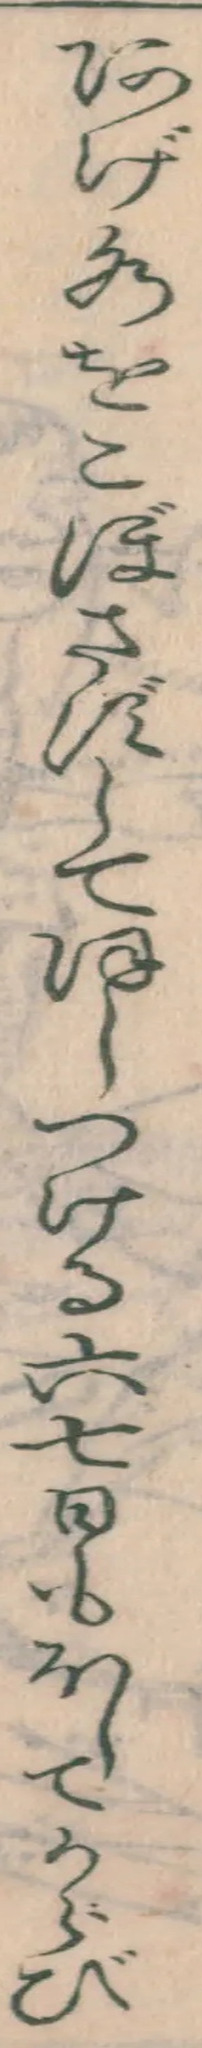あげ水をこぼさずしてほしつける六七日もほしてからび
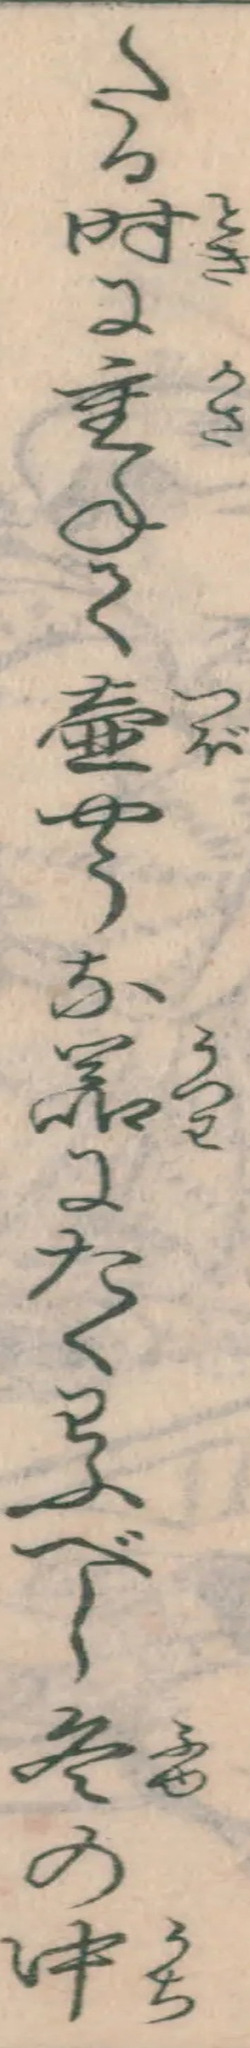たる時に重ねて壺やうな器にたくわふべし冬の中
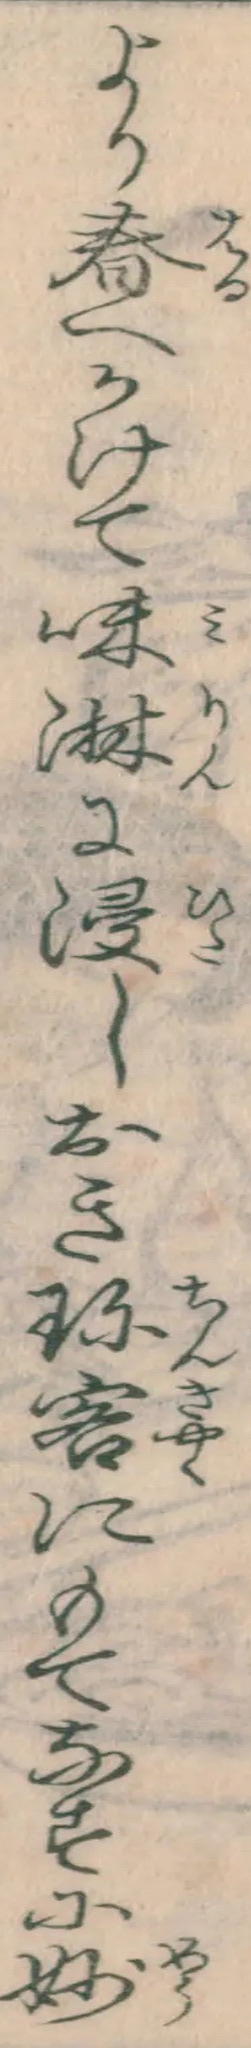より春へかけて味淋に浸しおき珍客にもてなすに妙
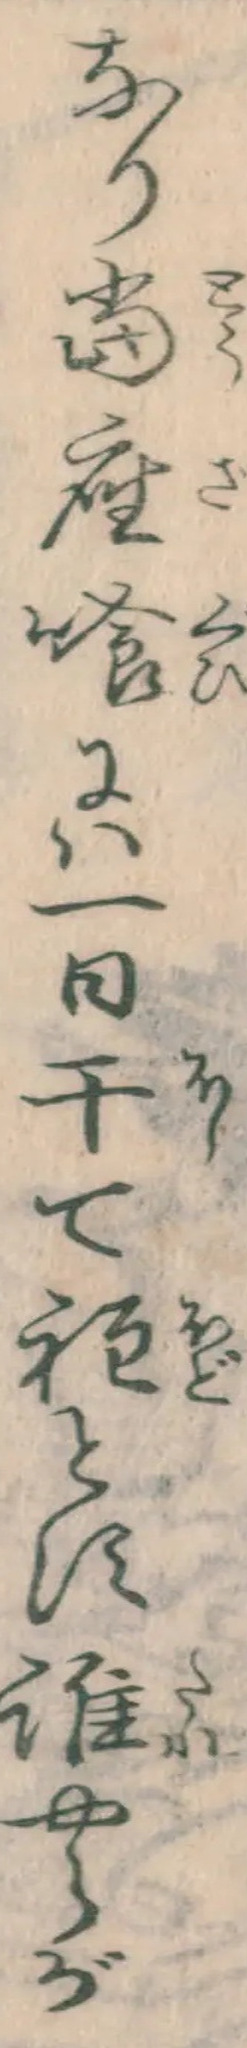なり当座喰には一日干て程とす誰やらが
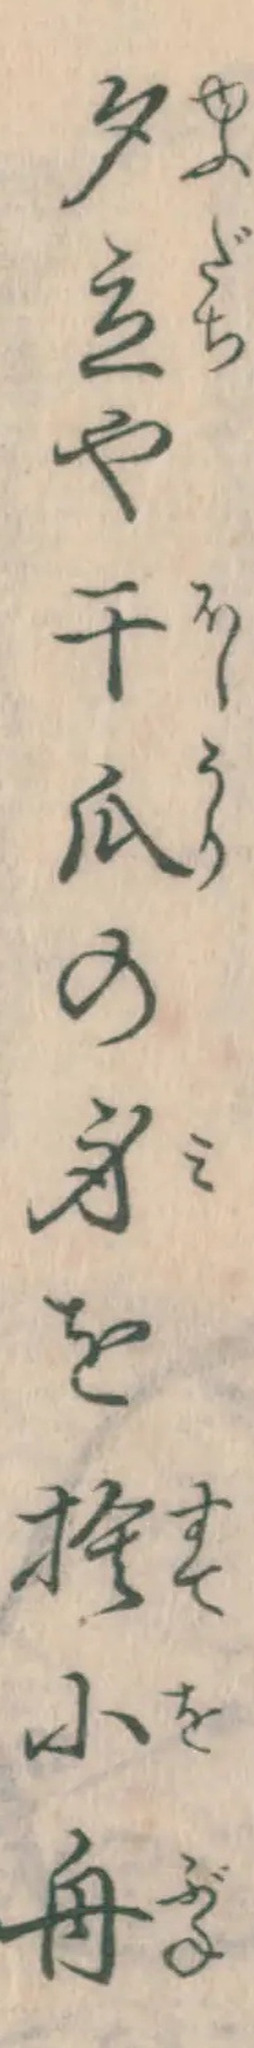夕立や干瓜の身を捨小舟
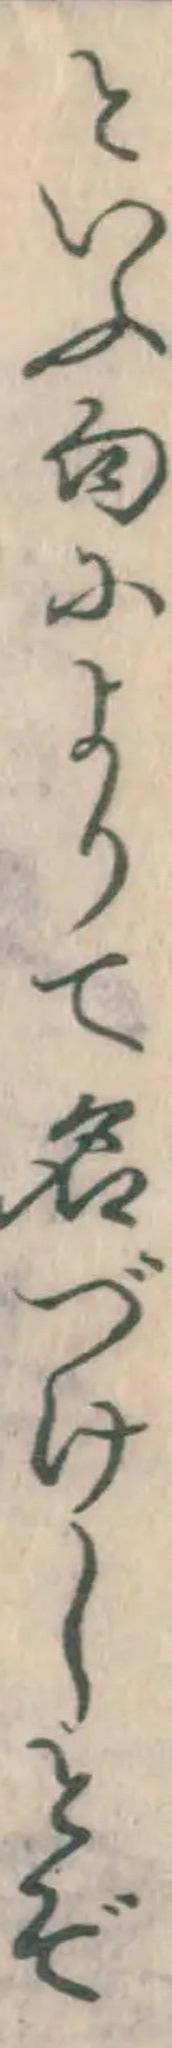といふ句によりて名づけしとぞ
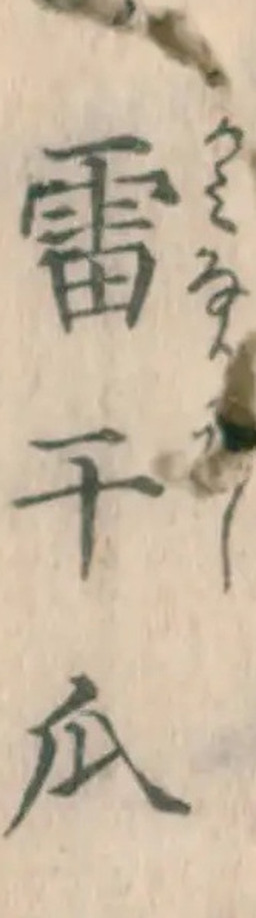雷干瓜

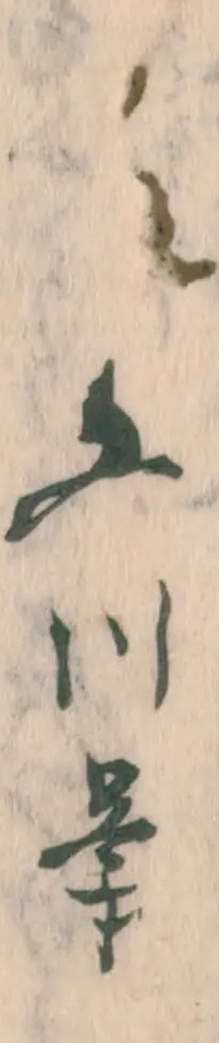文川筆
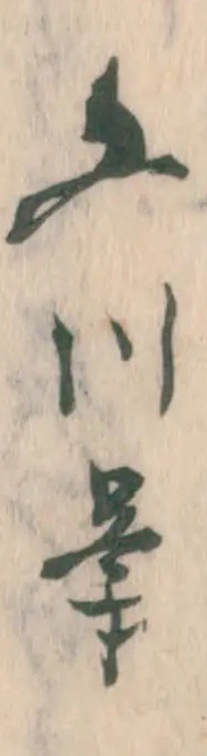文川筆
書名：四季漬物鹽嘉言
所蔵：国立国会図書館 National Diet Library, JAPAN
